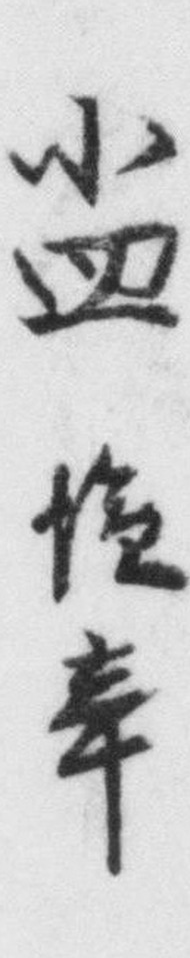小皿塩辛
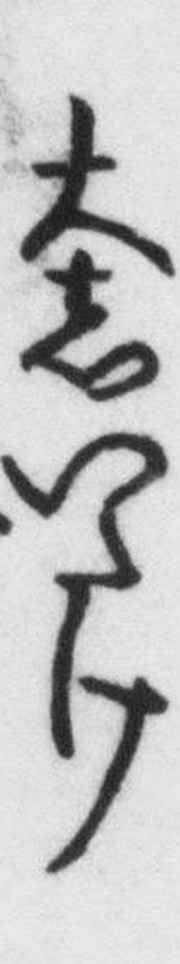大しいたけ
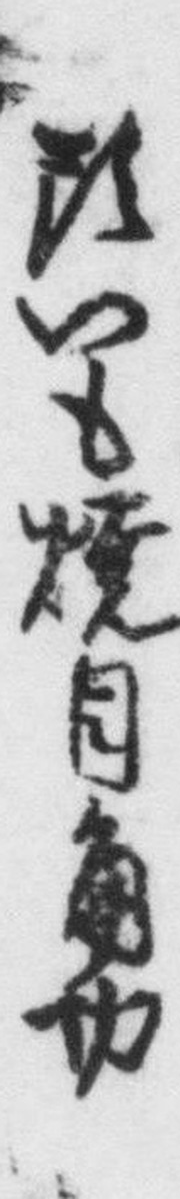いも焼目角切
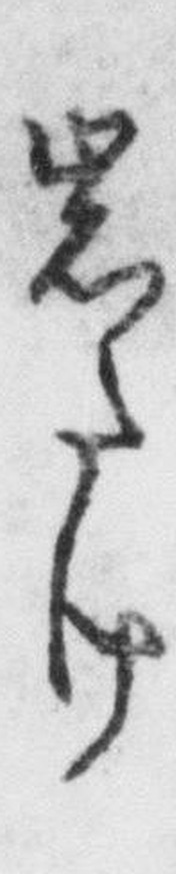岩たけ

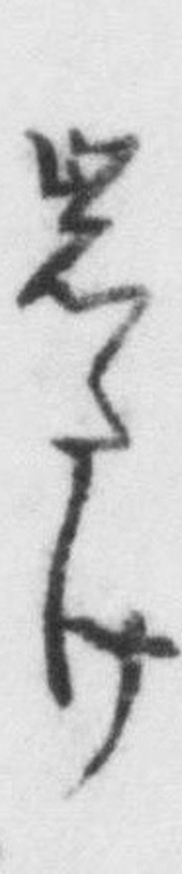初たけ
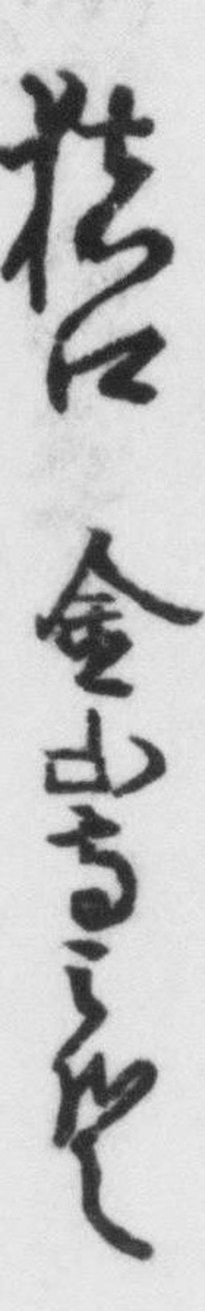猪口金山寺みそ
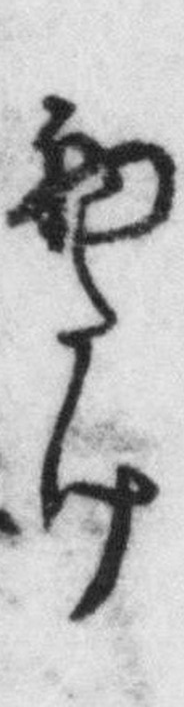初たけ
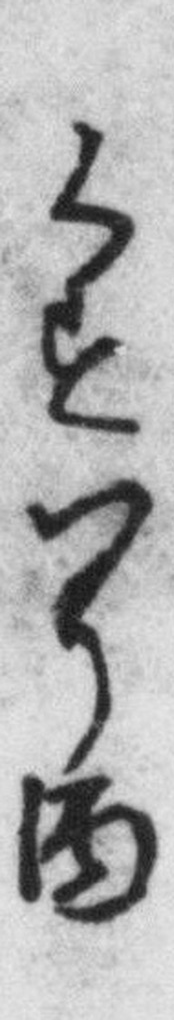くすいり酒
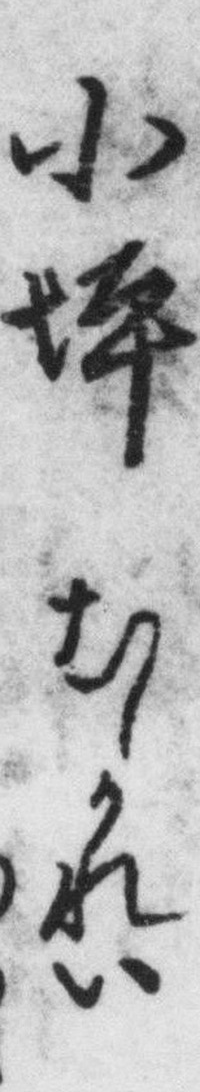小坪むしかれい
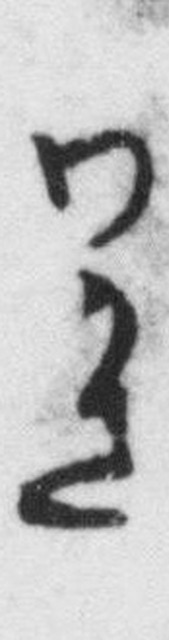わかさ

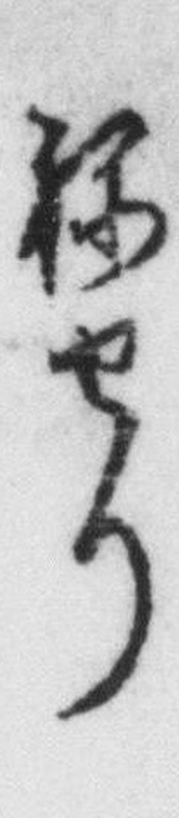ねせり
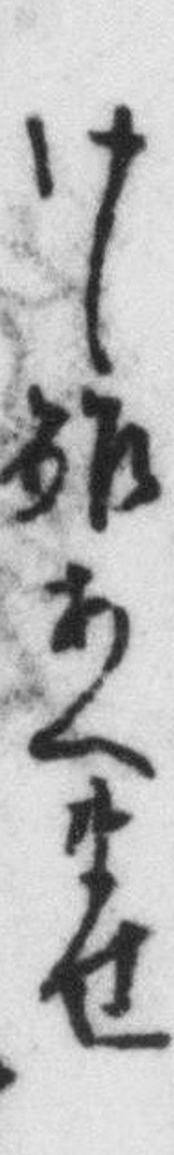けし酢あへませ
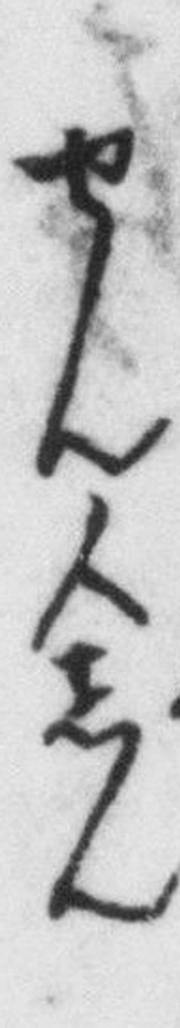せん人しん
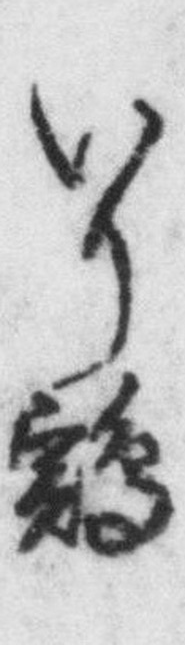いり鶏
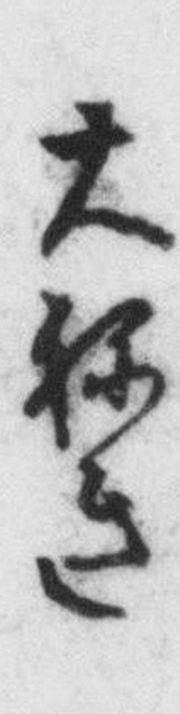大ねき
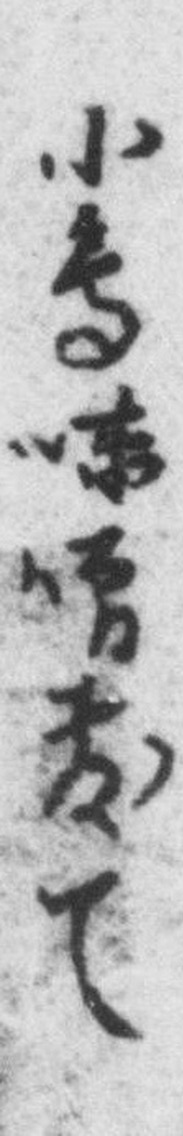小鳥味噌敷て
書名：卓子料理仕様
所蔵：大阪府立大学学術情報センター 国文学研究資料館
